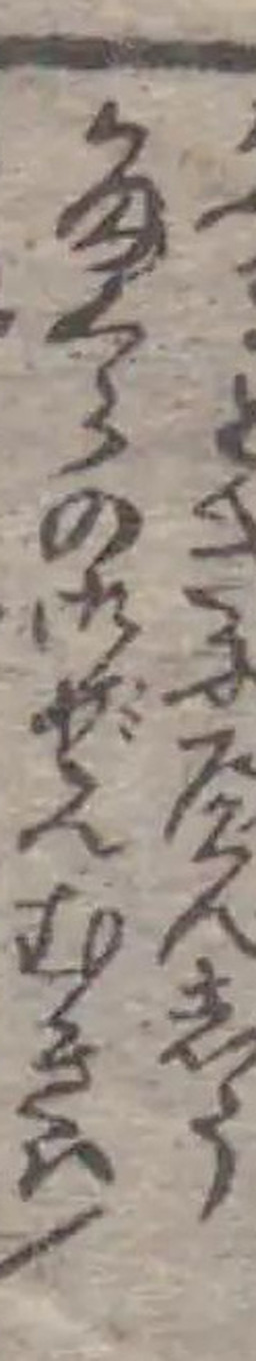かまくらの御ぜんむきは
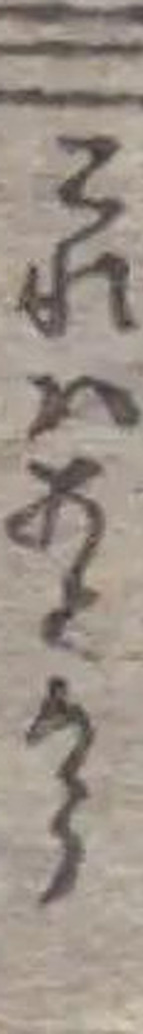これはあとから
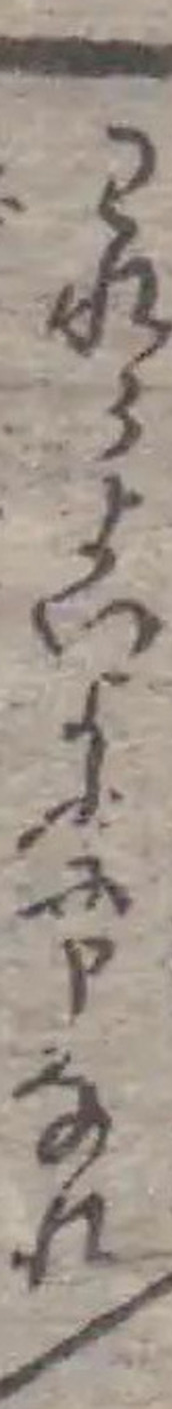われらよいよふに申なれ
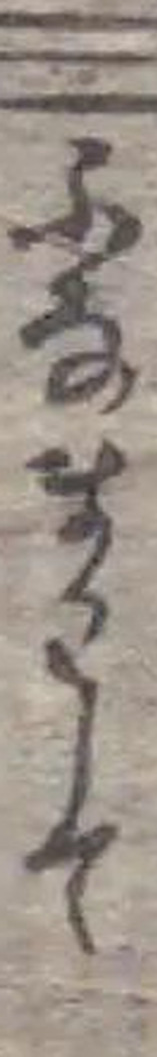ふなまわして
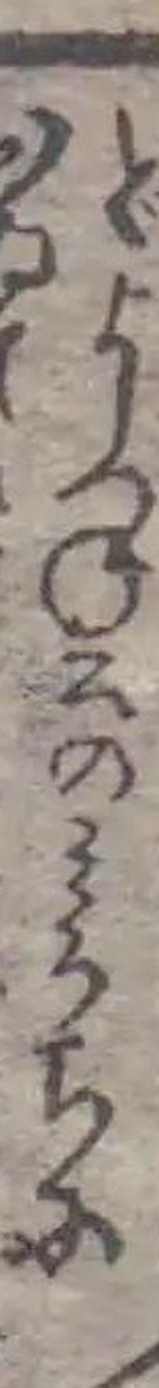どよしつね公のみうちに
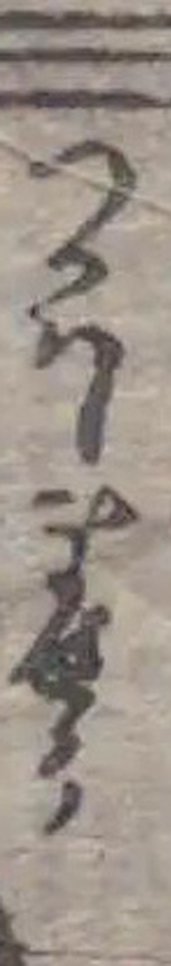つかはしませう
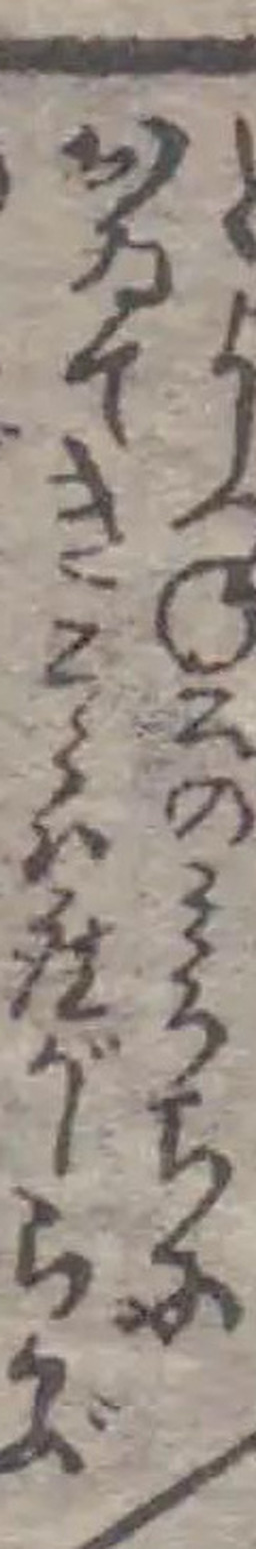おゐてきこうは座がしらかぶ
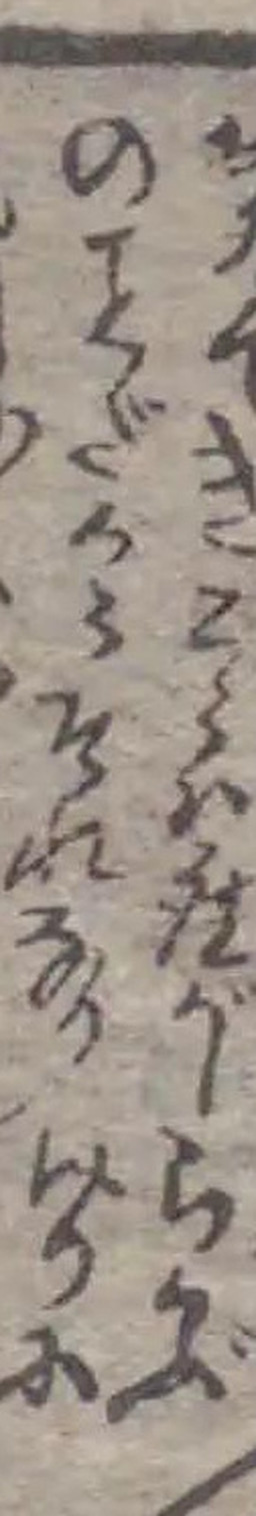のことだからそれなりけりに
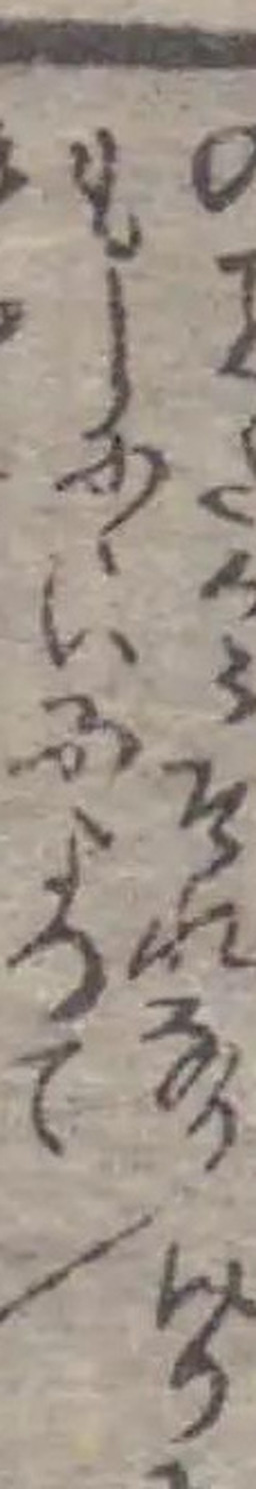もしにくいによつて
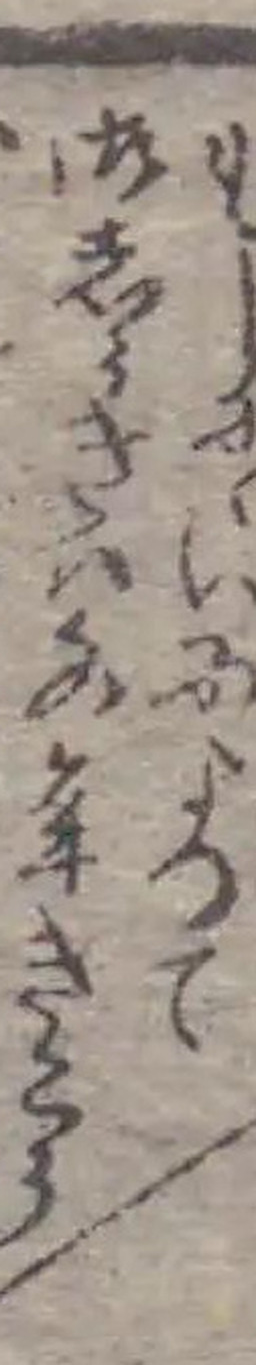御しうきは千年きこう
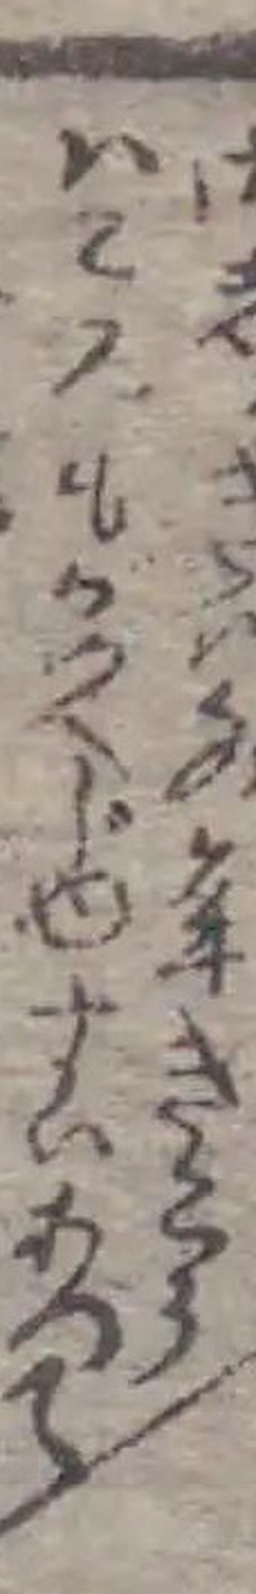はころもかはへじゆすいあつて
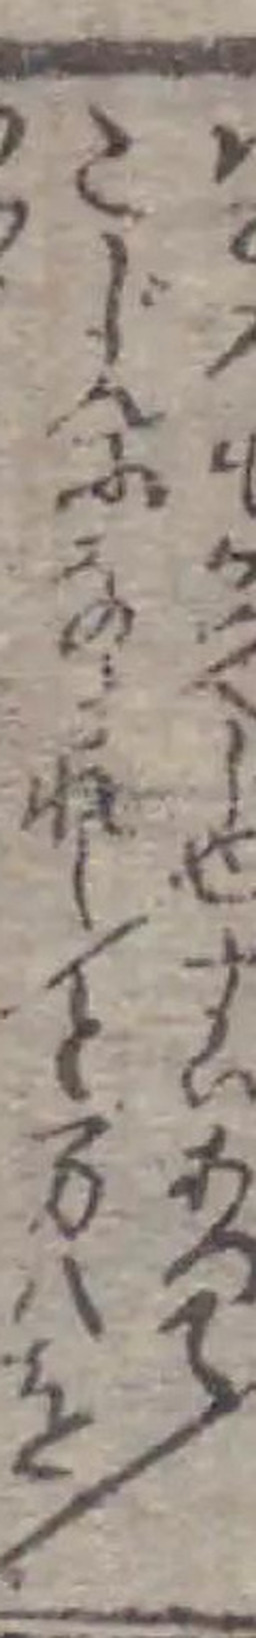こじんになられしと万八を
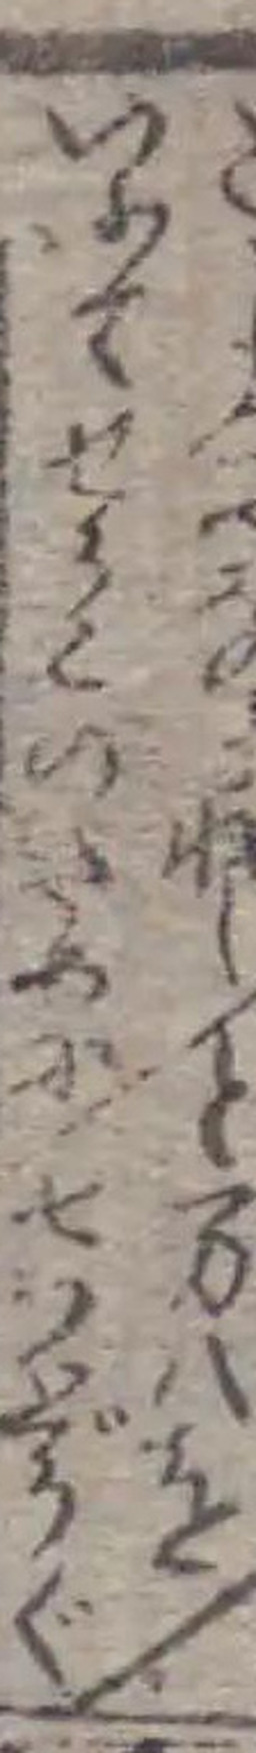いふてせうこのために七つどうぐ
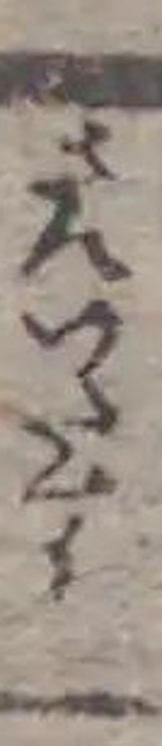さんいたす
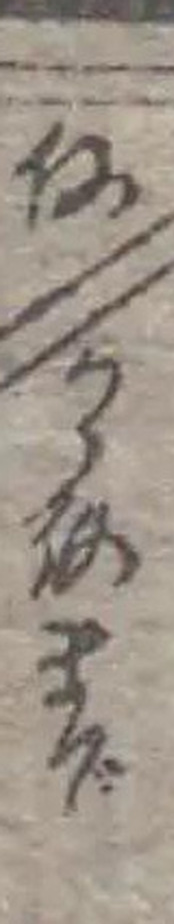何から何まで
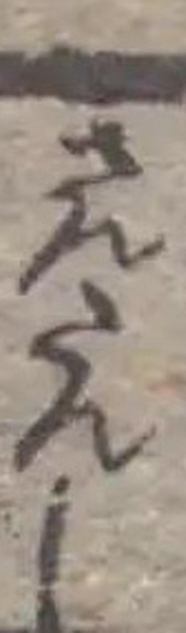さんたん
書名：通増安宅関 2巻
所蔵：国立国会図書館 National Diet Library, JAPAN
